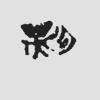則
